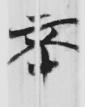不
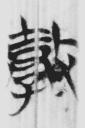{𣪊子}
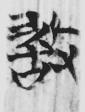敢
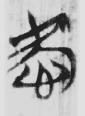{旡心}
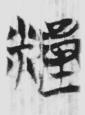糧
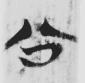公
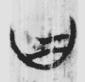曰
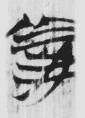義
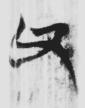父
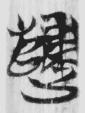歸
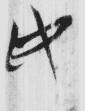女
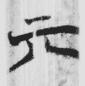亓
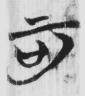可
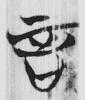言
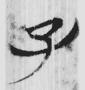子
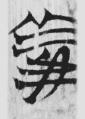義
